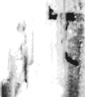北
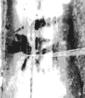見
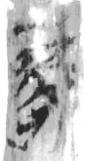啟
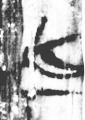必
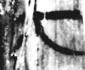大
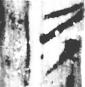死
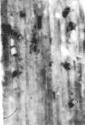未
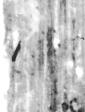少
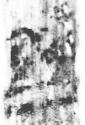翏（瘳）
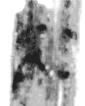大
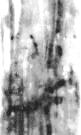翏（瘳）
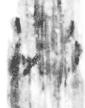死
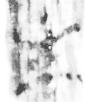生
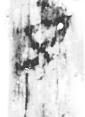才（在）
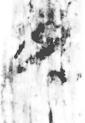丑
